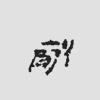所
